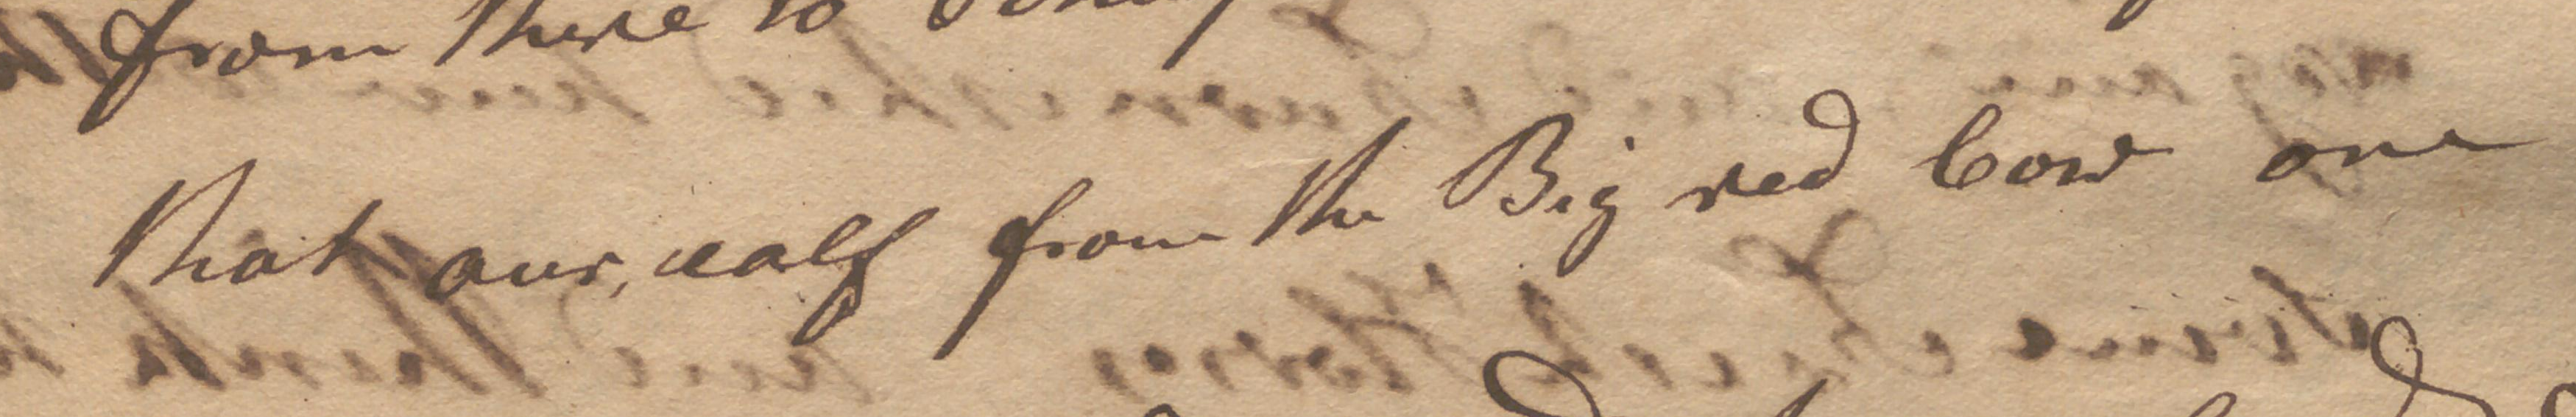that our calf from the Big red Cow one
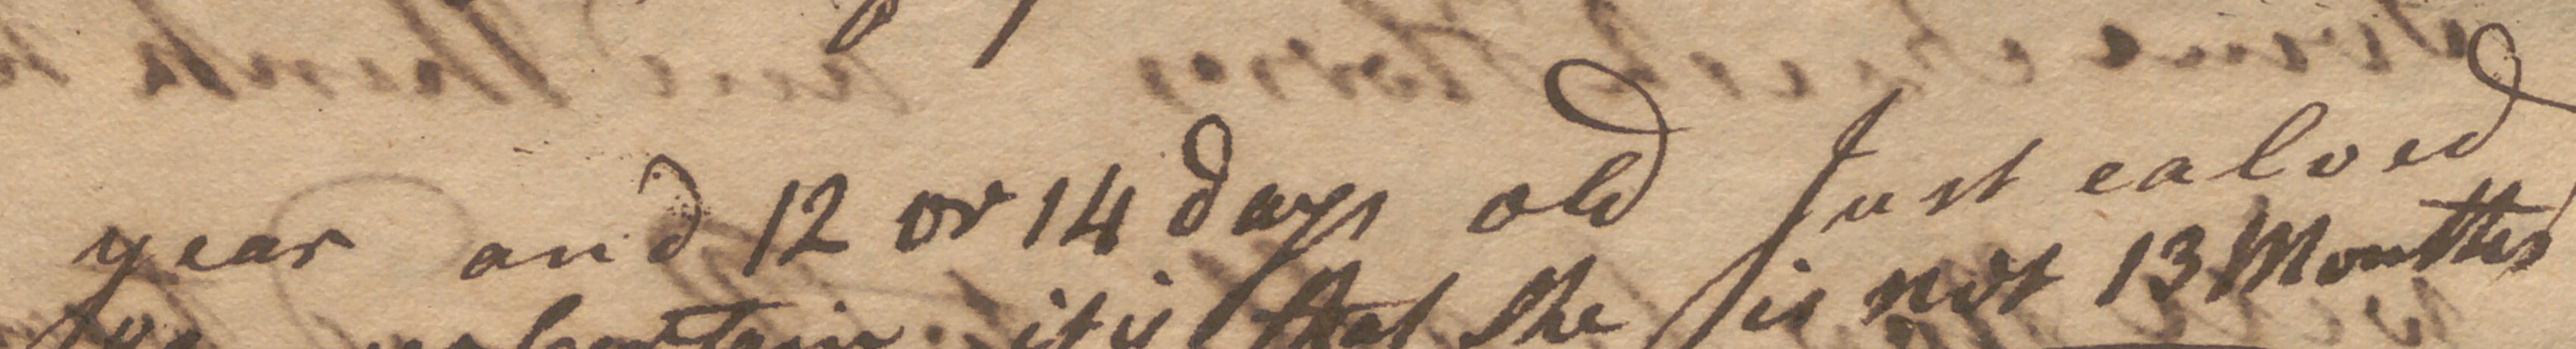year and 12 or 14 days old Just calved
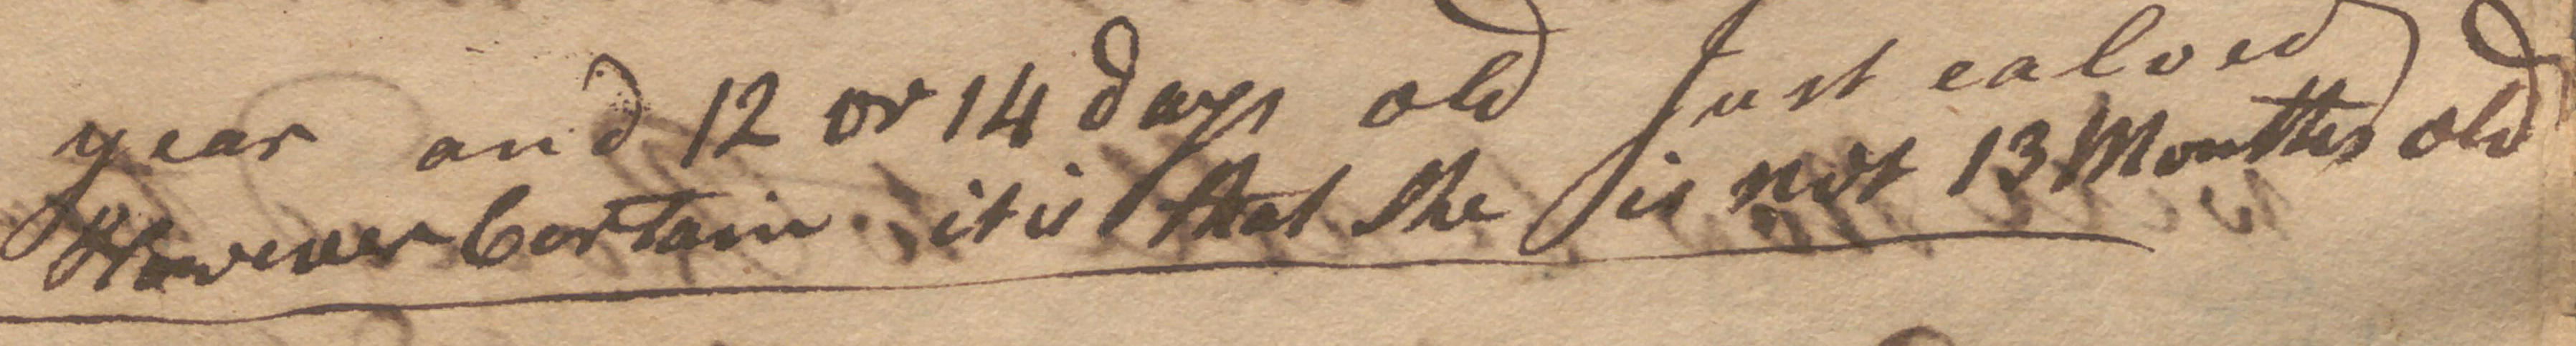However Certain it is that she is not 13 Months old
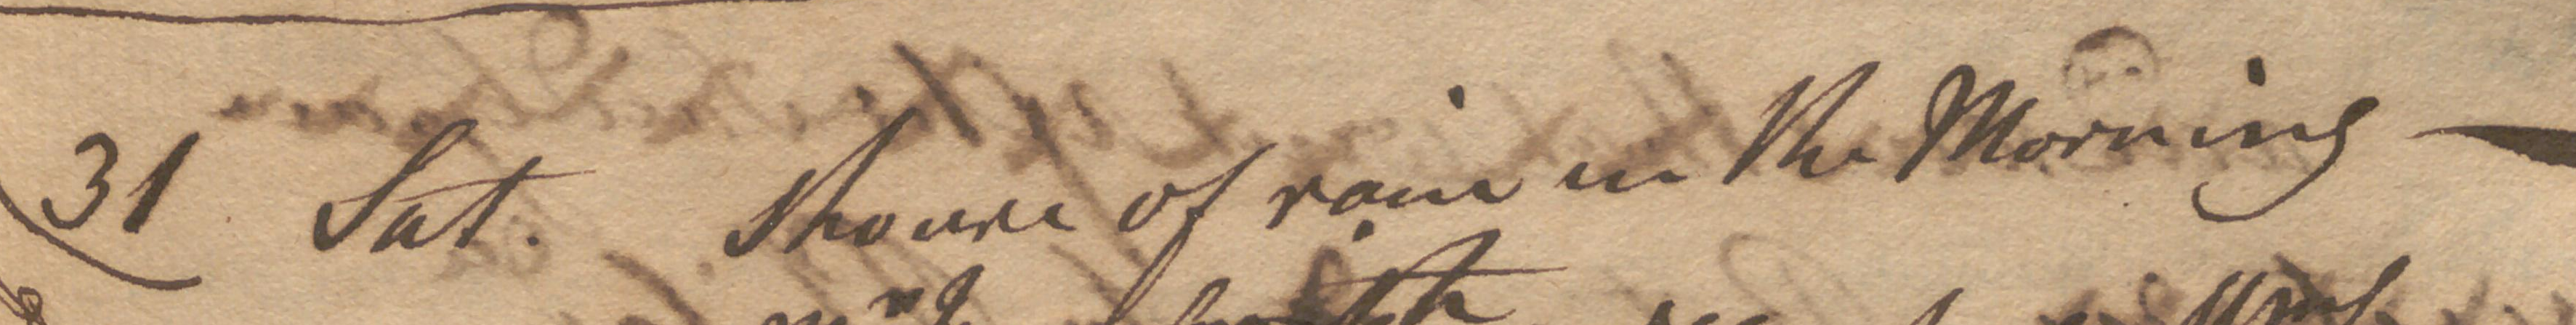31 Sat. shoure of rain in the Morning-
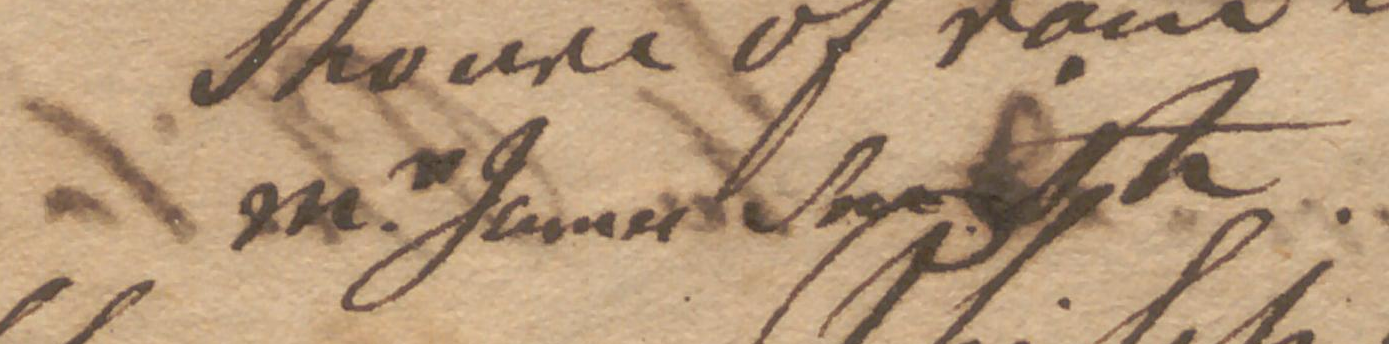M^r. James Smith
